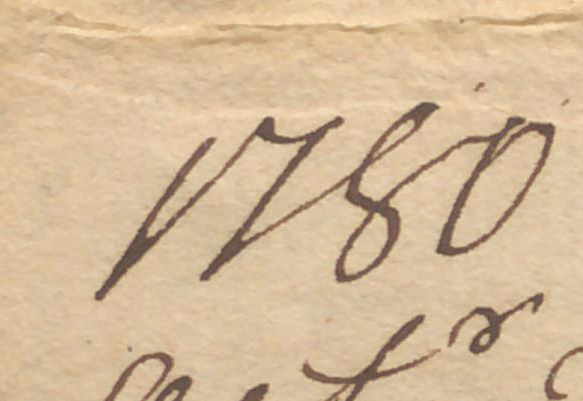1780
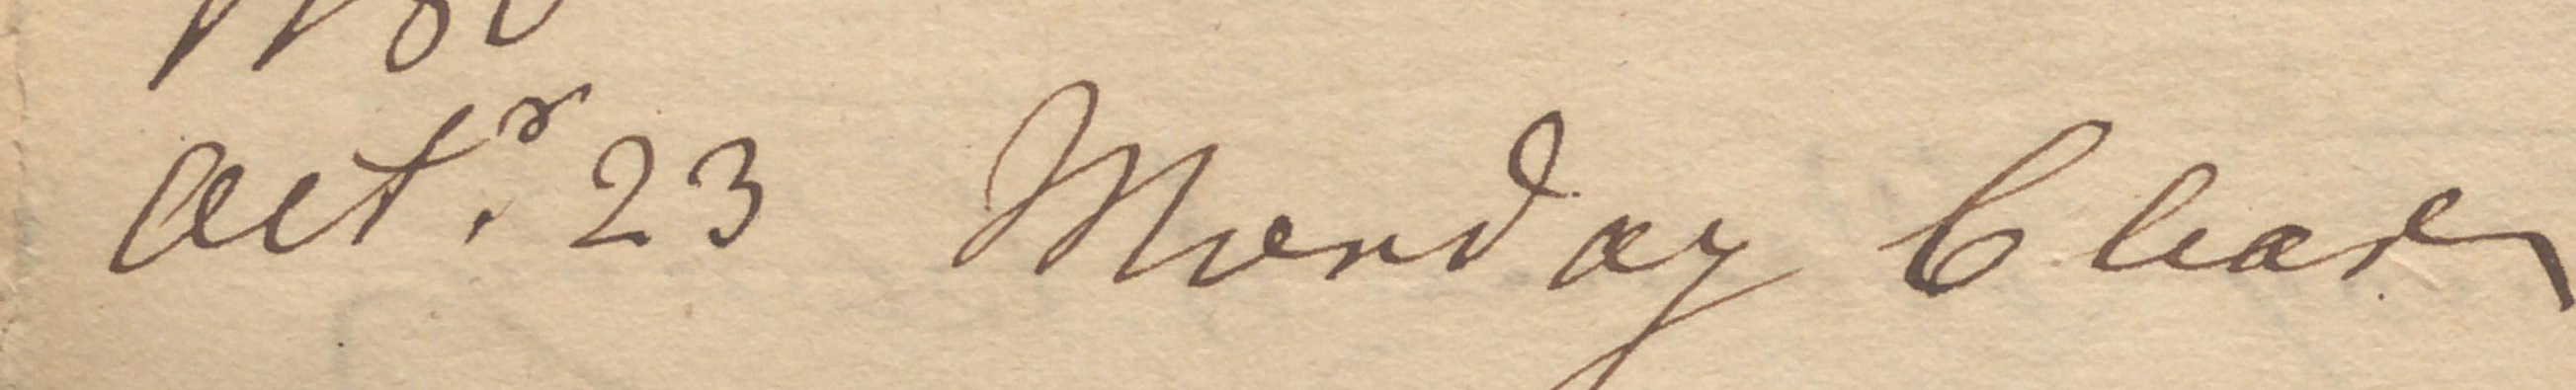Oct^r. 23 Monday, Clear
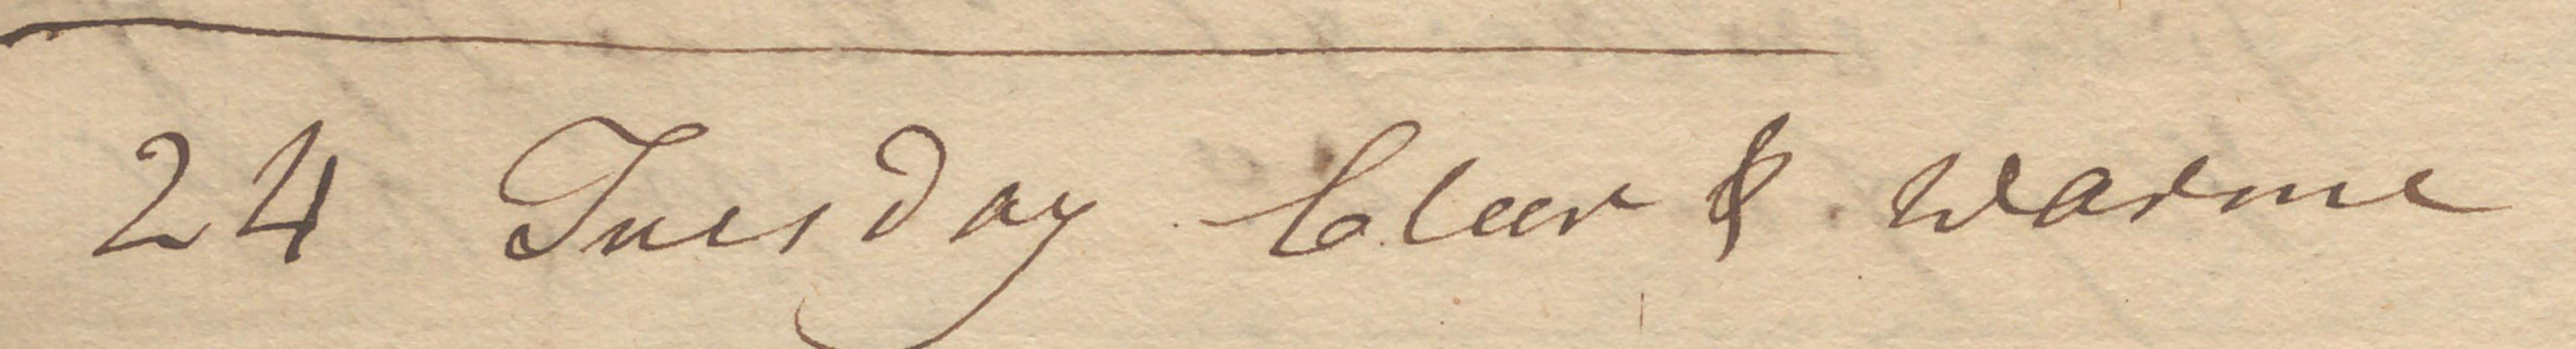24 Tuesday Clear & warme
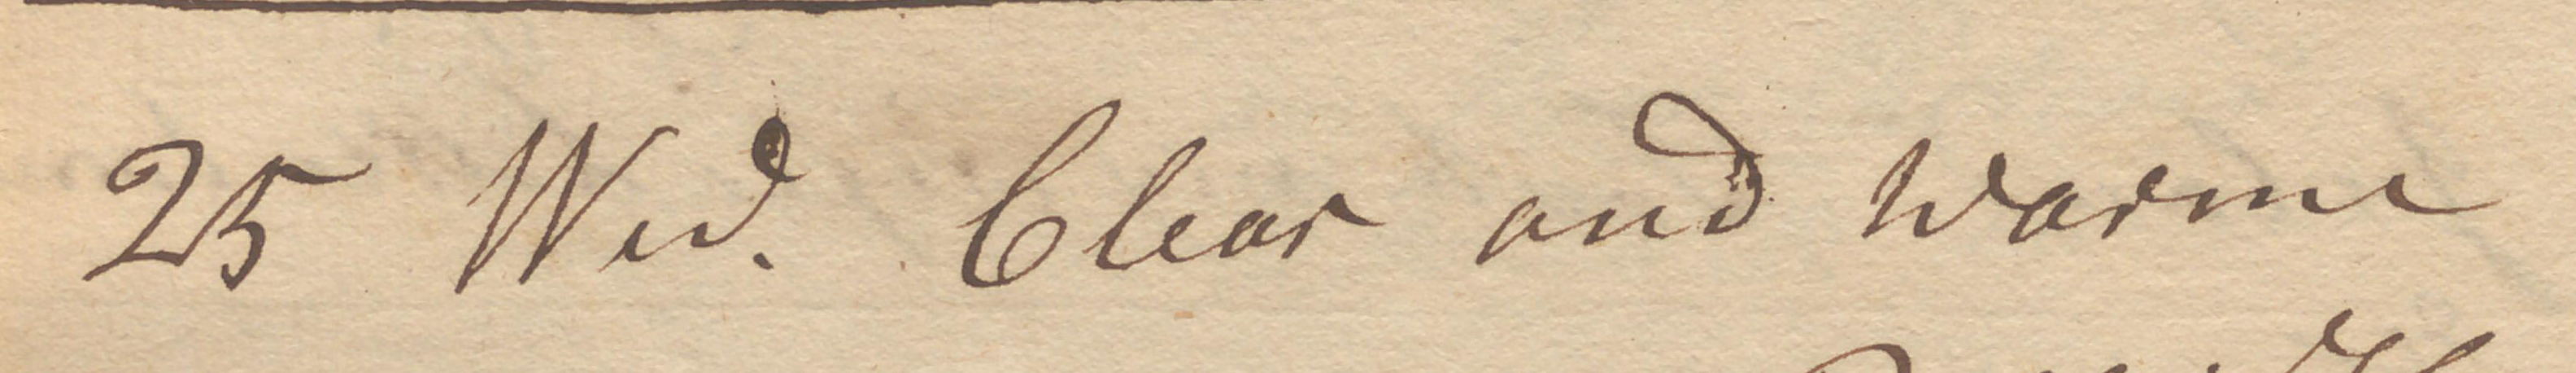25 Wed. Clear and warme
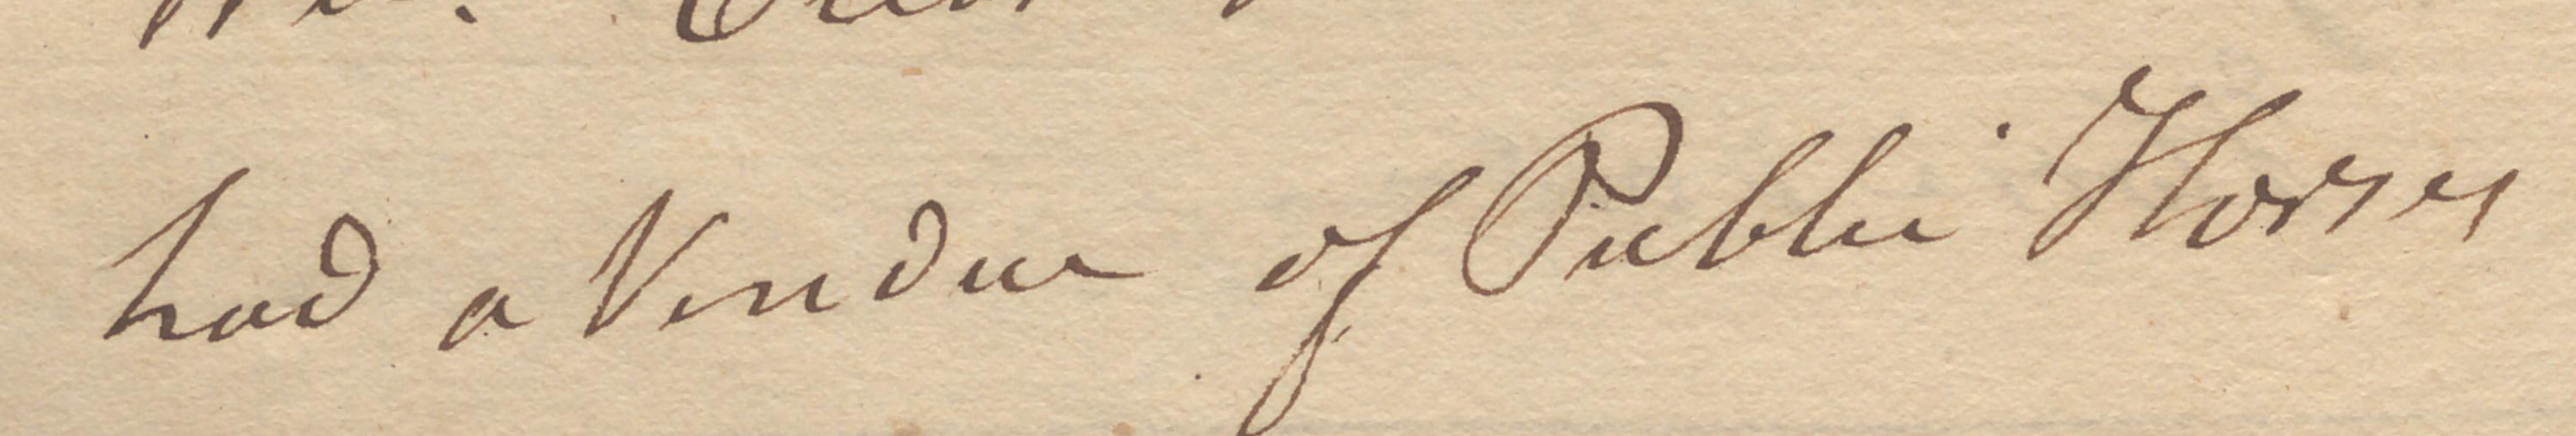had a Vendue of Public Horses
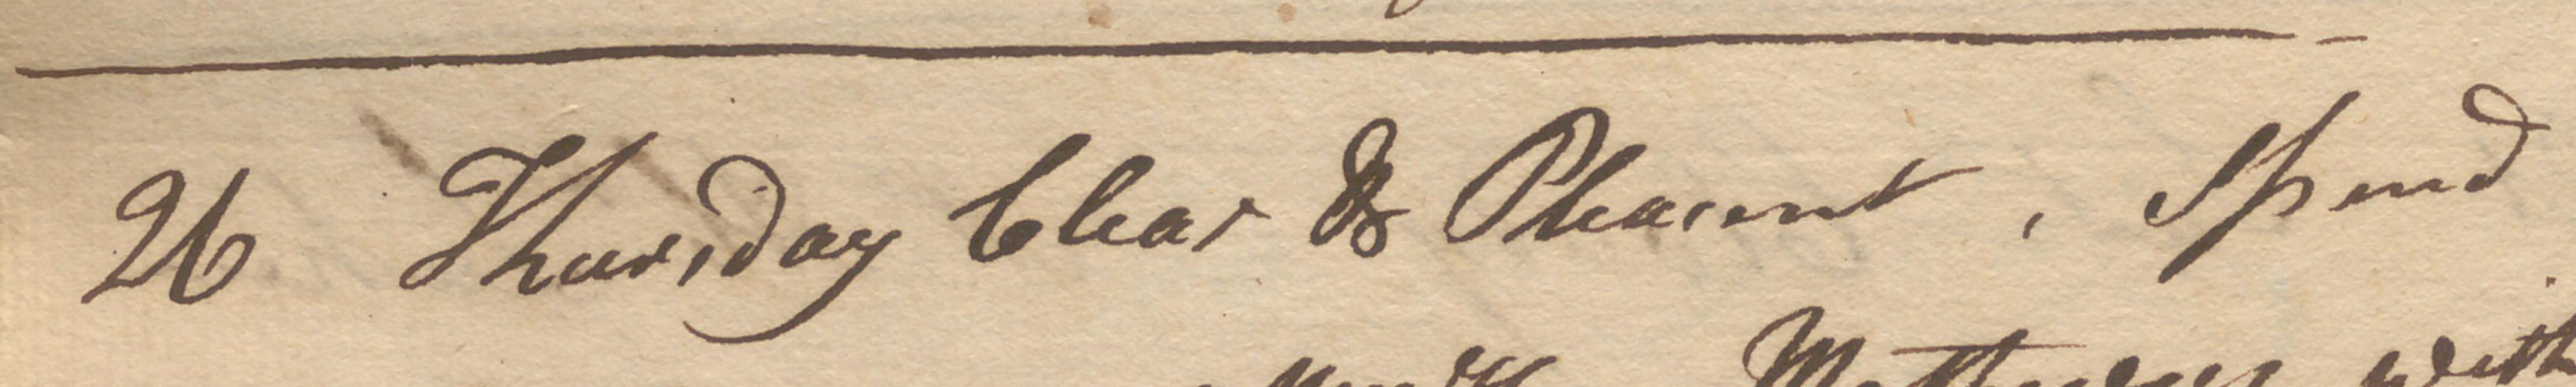26 Thursday Clear & Pleasent, spend
